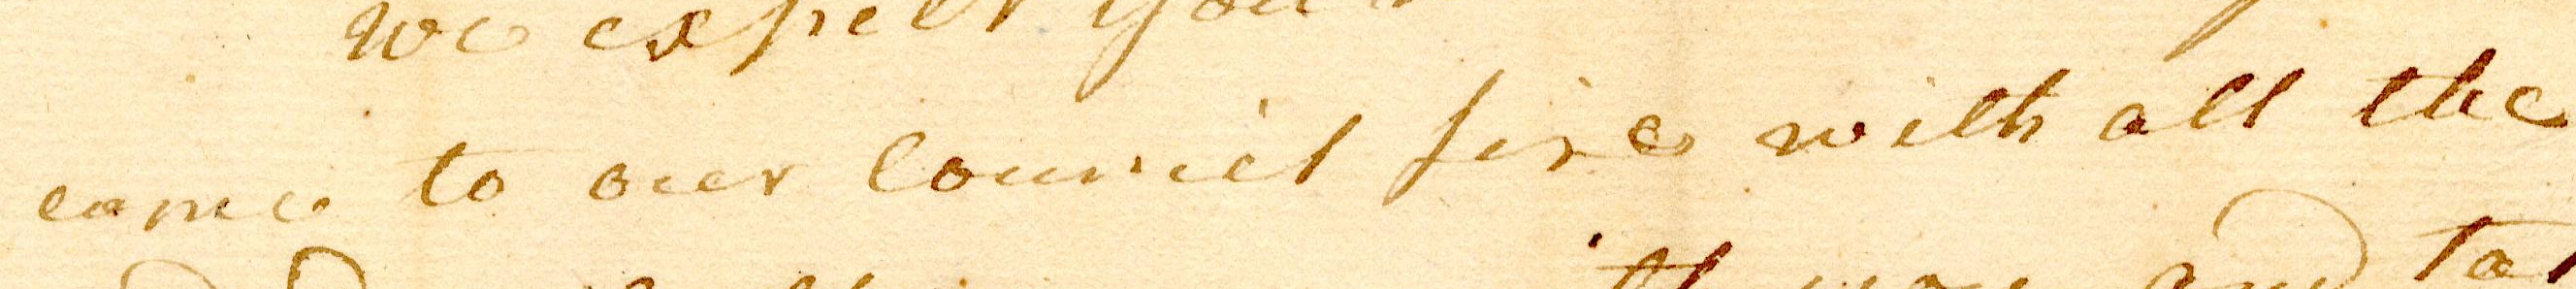come to our council fire with all the
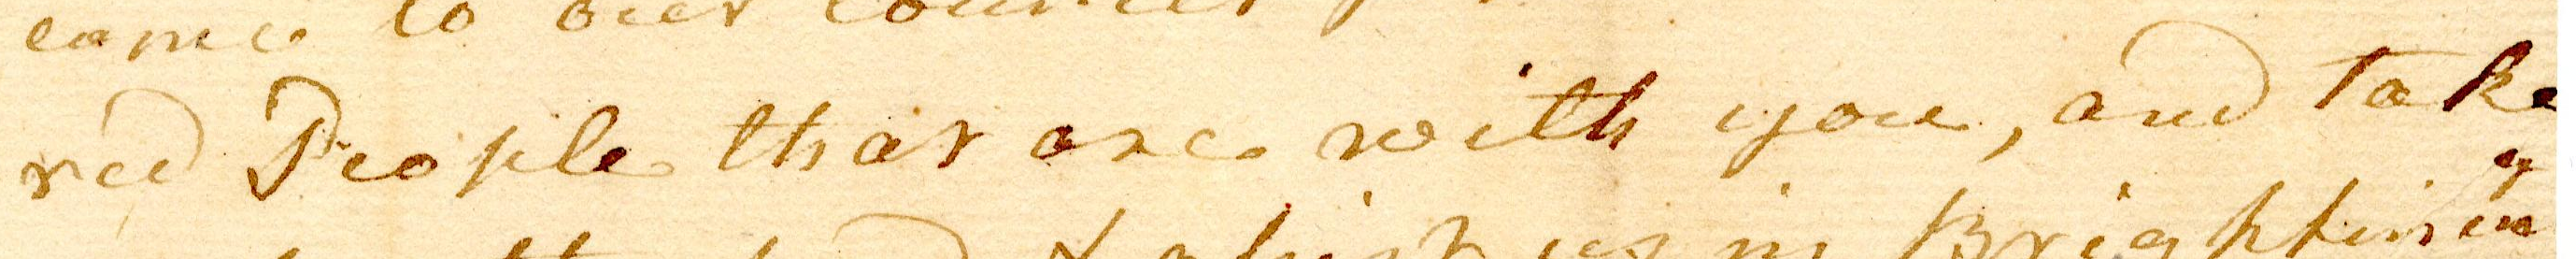red People that are with you, and take
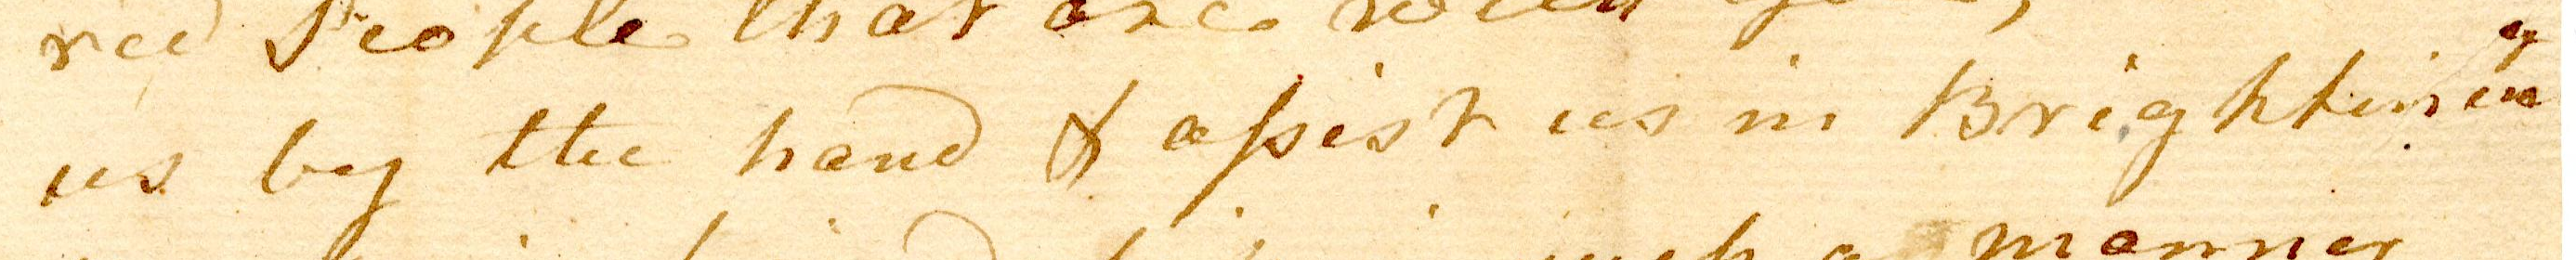us by the hand & assist us in Brightening
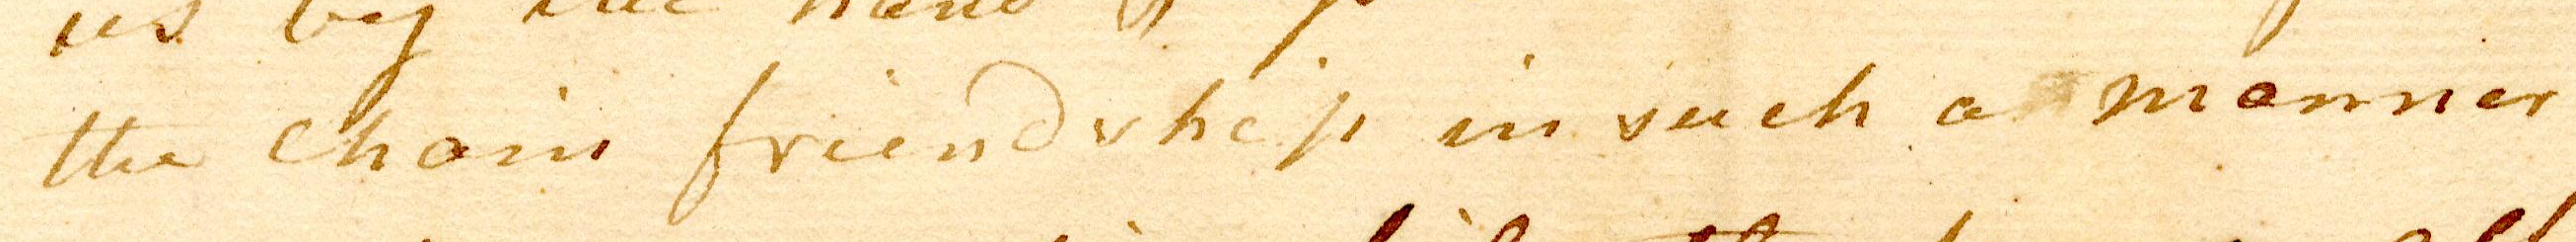the Chain friendship in such a manner
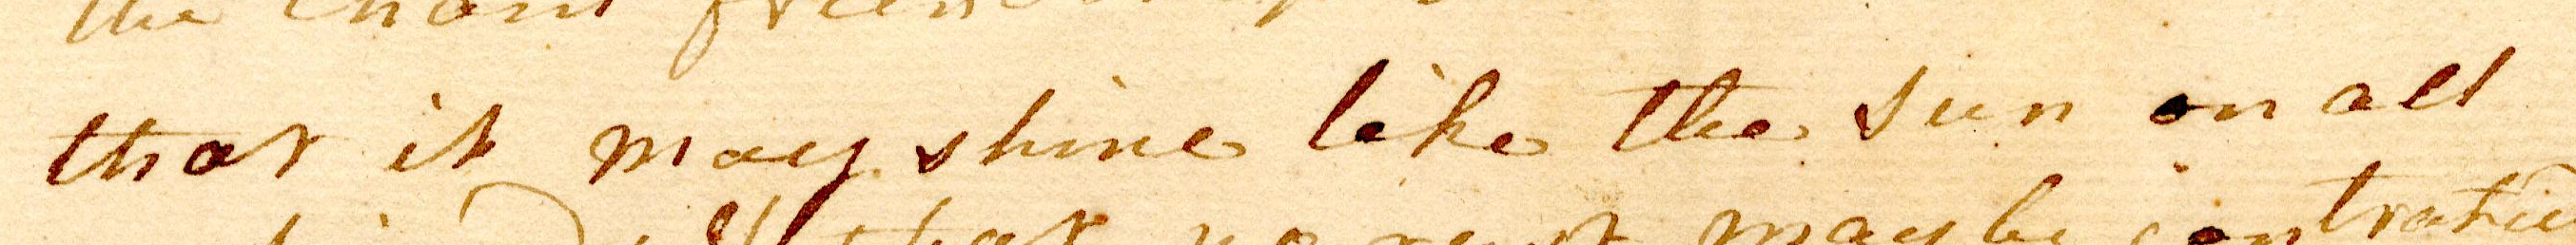that it may shine like the sun on all
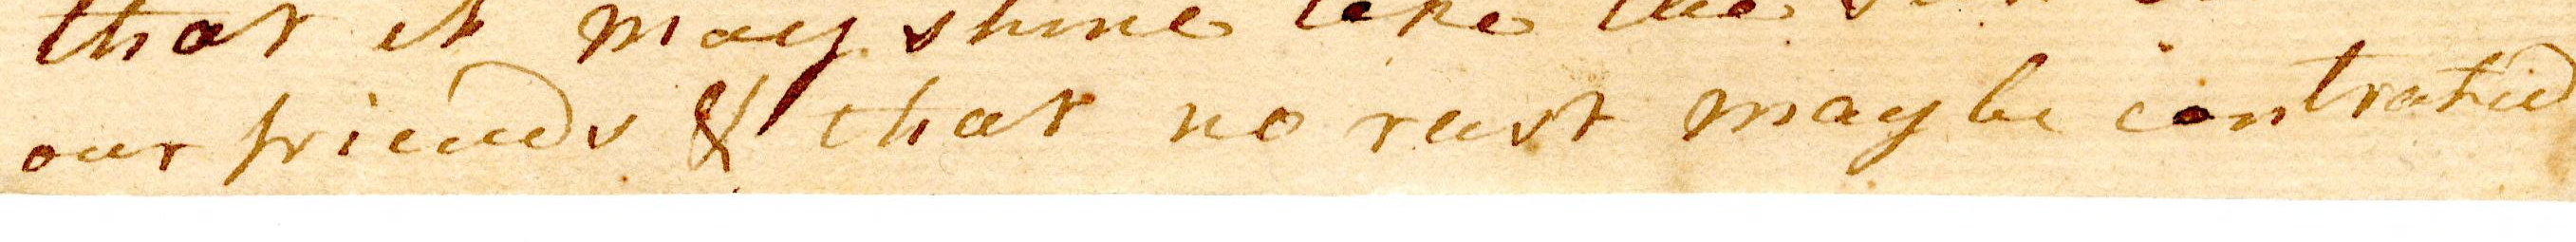our friends & that no reevt may be contracted
